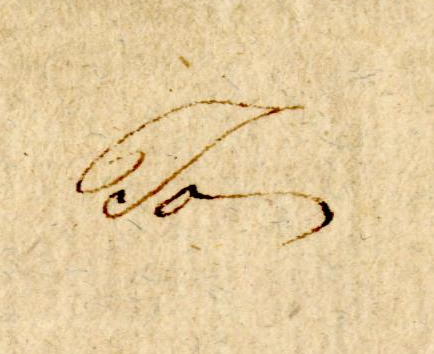To
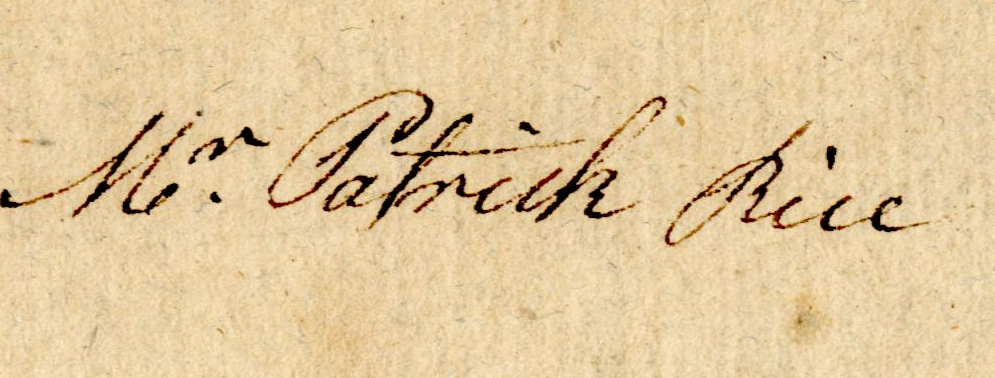M^r Patrick Rice
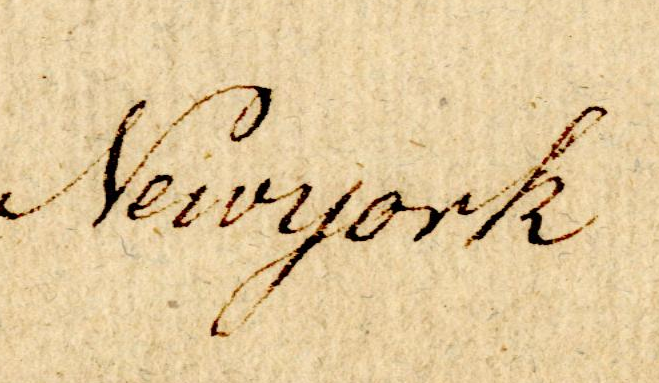New York
